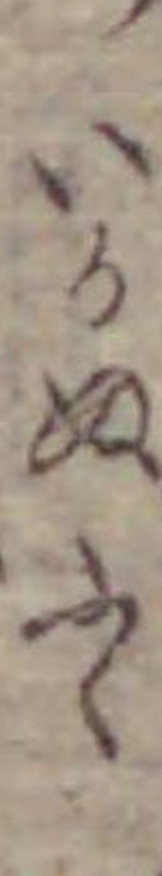いかぬふく
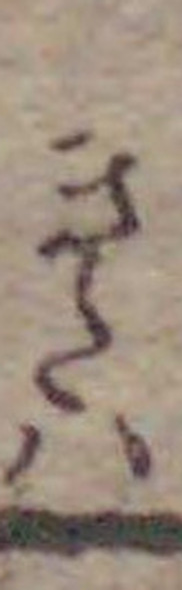きたは
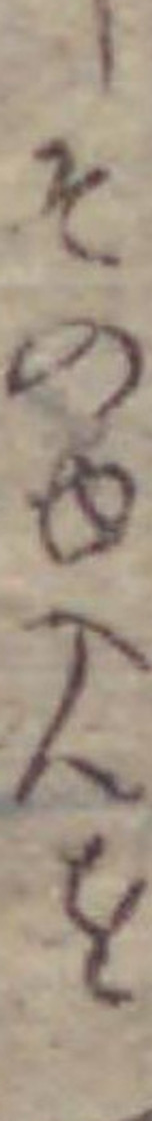そのゆへんを
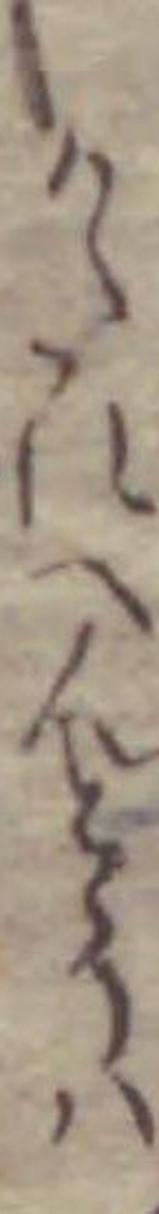かたれへんとうは
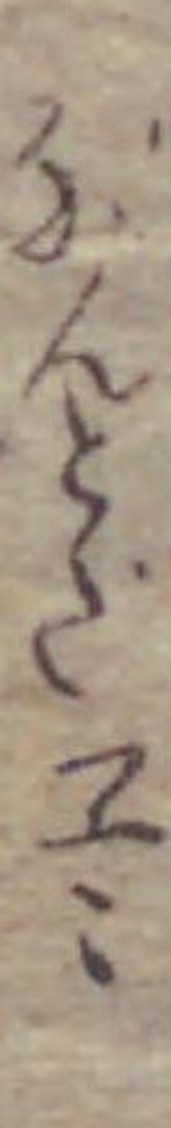なんとだヱヽ
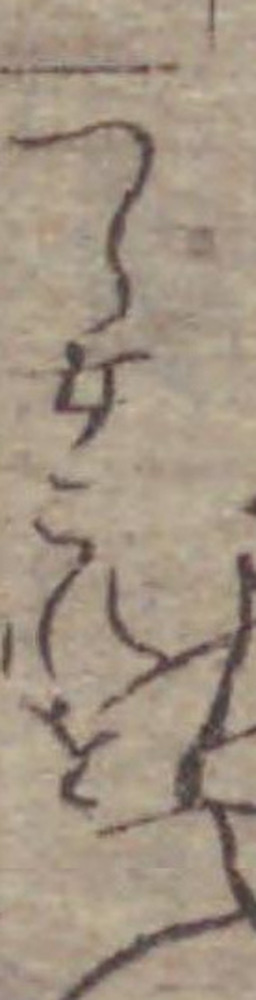つら女これを
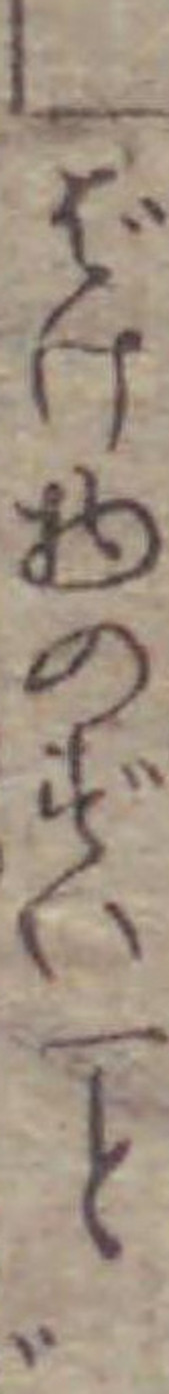ばけ物のずい一と
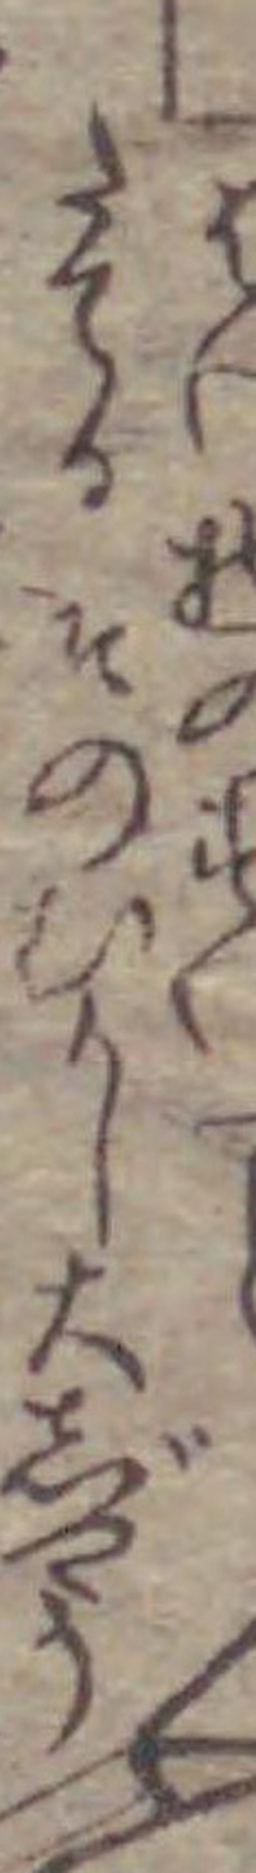たてるそのむかし大じやう
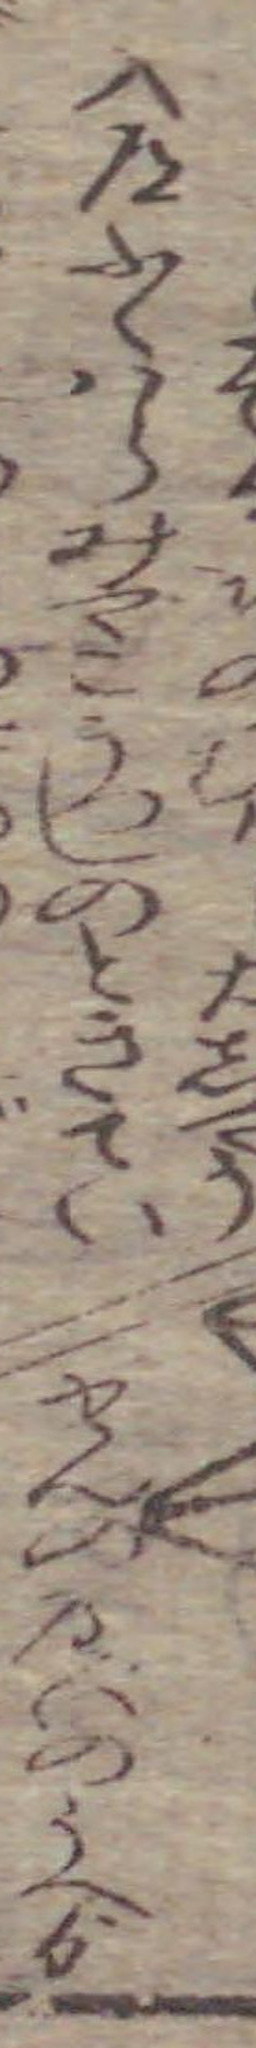入道ふくはらみやこうつしのときていせんのへいのうへゟ
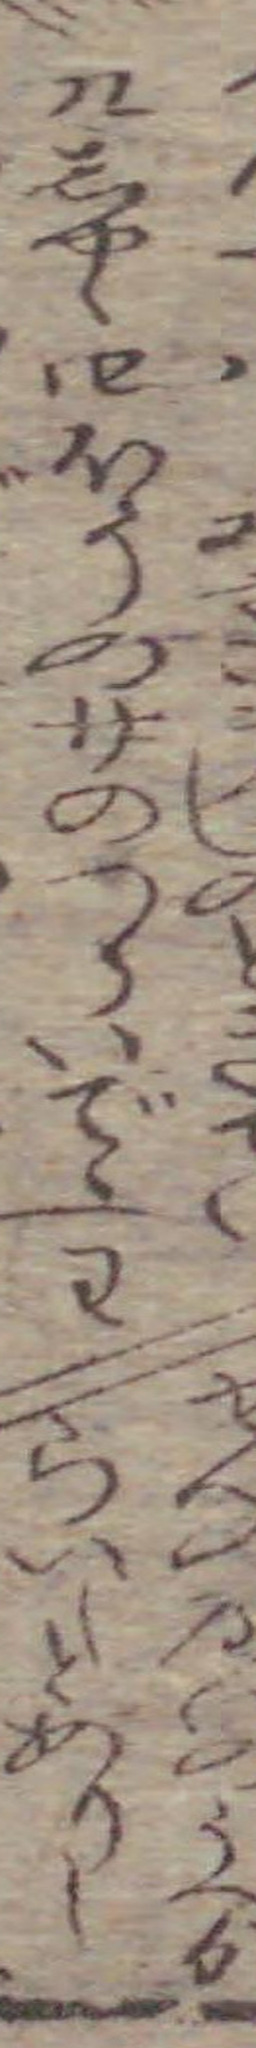九しやく四ほうのつらいでゝわらいしとありし
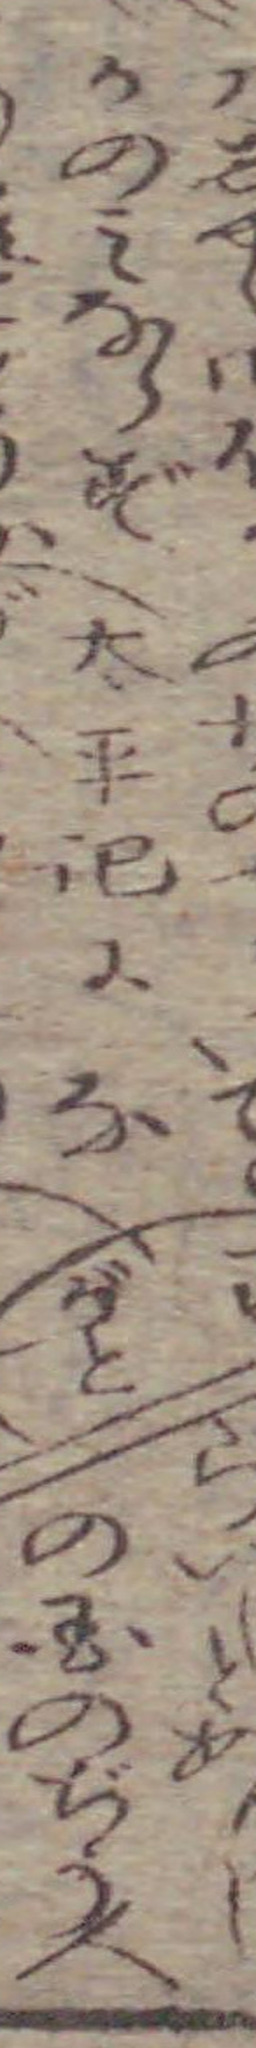かのみならず太平記にながとの国のぢう人
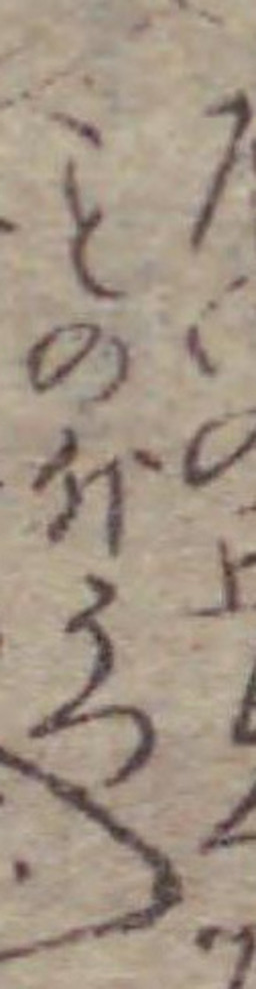ことの外うつ
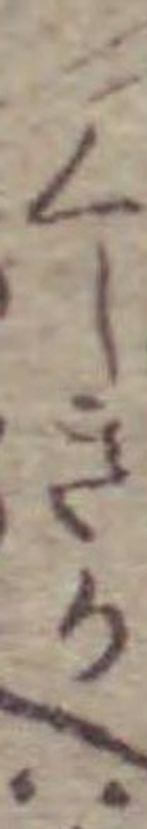くしきか
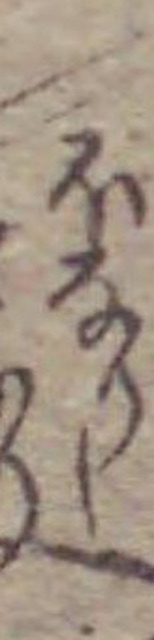ほなりし
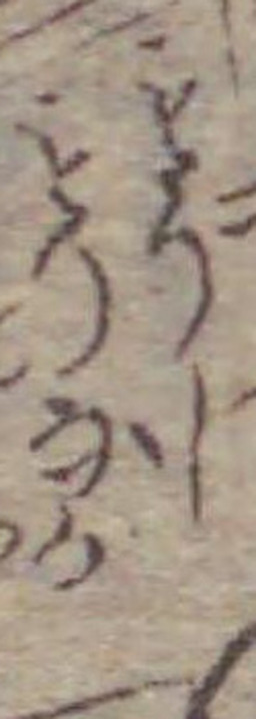もりなか

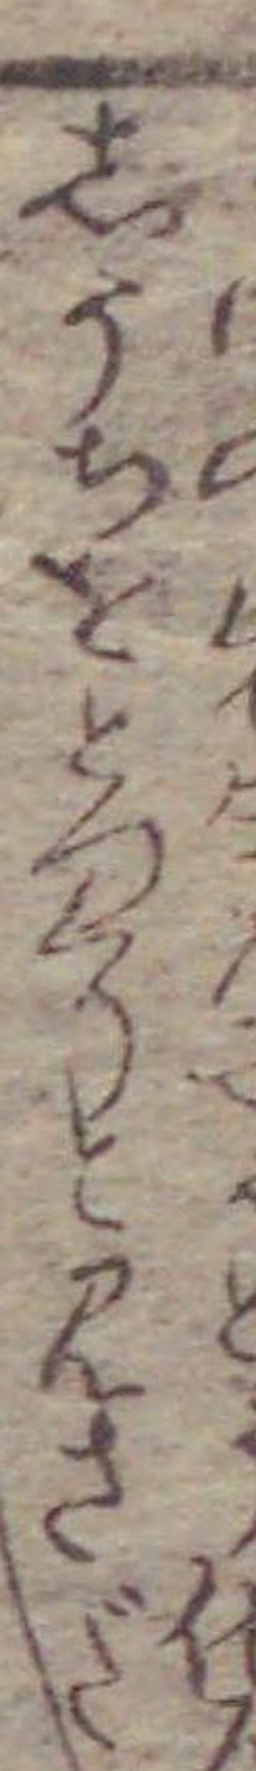しうちをとつくりと見さだ
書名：妖怪仕内評判記 : 2巻
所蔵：国立国会図書館 National Diet Library, JAPAN
